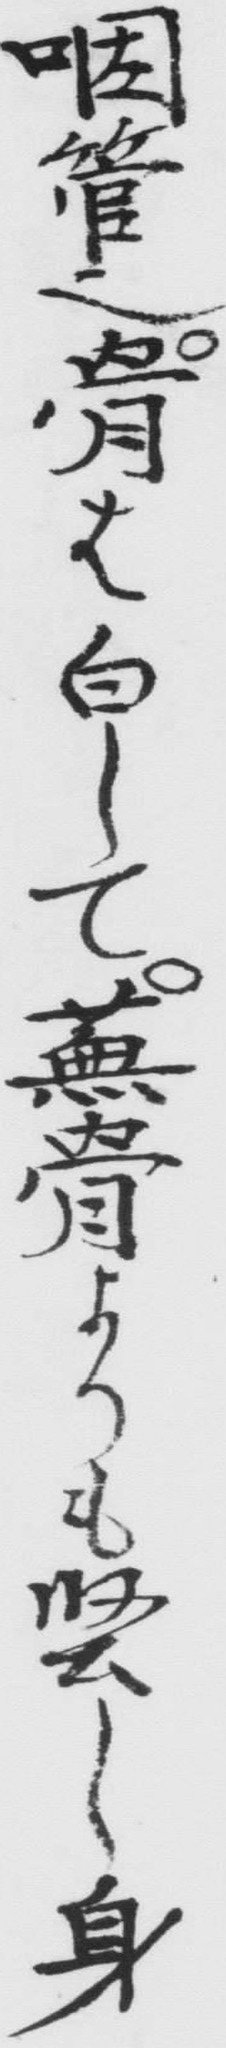咽輪身咽管也。骨は白して。蕪骨よりも堅し身
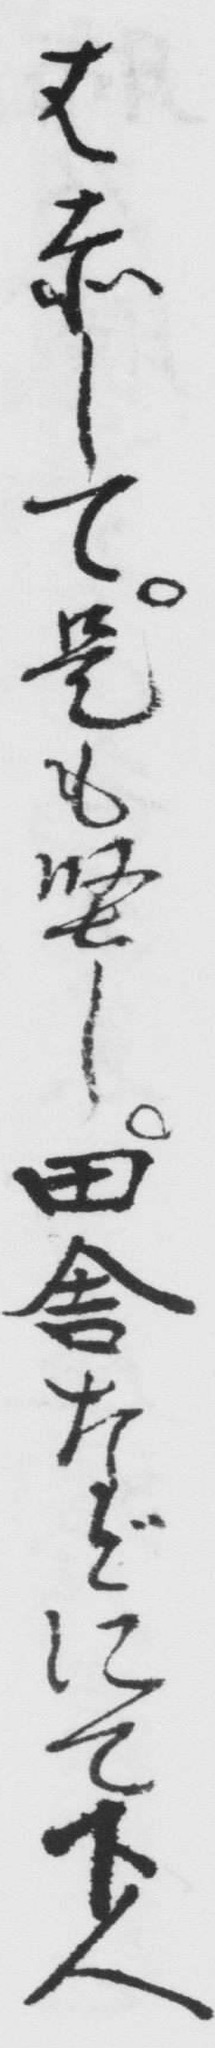は赤して。是も堅し。田舎などにて下人
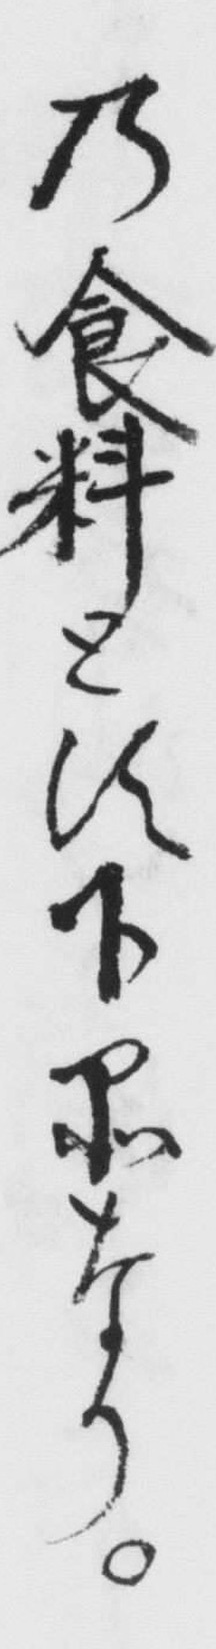の食料とす下品なり。
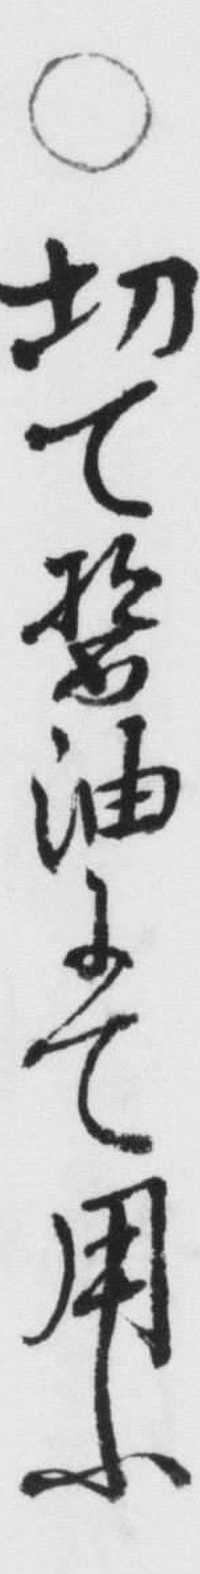○切て醤油にて用ふ
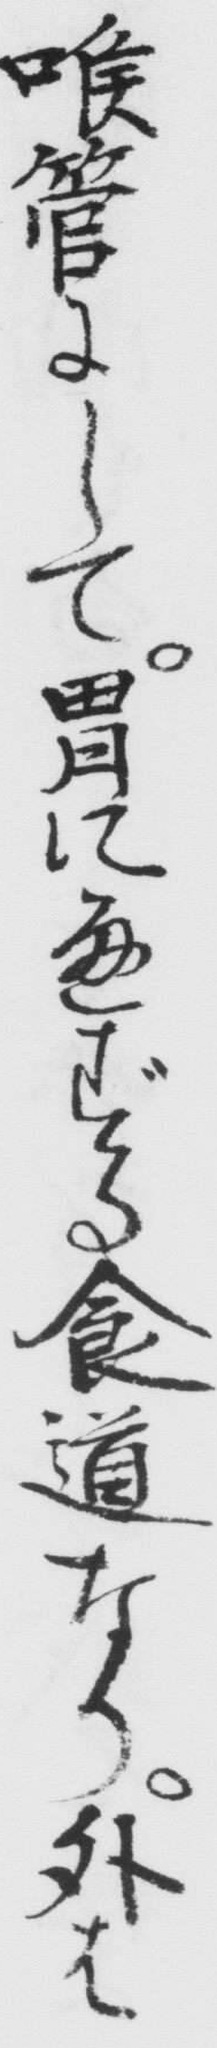ヒメ咽管にして。胃に通ずる食道なり。外は

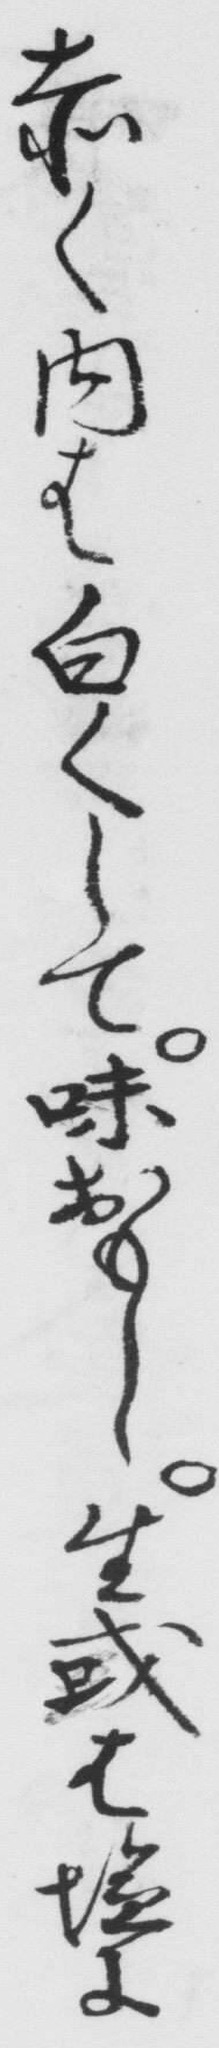赤く内は白くして。味おもし。生或は塩に
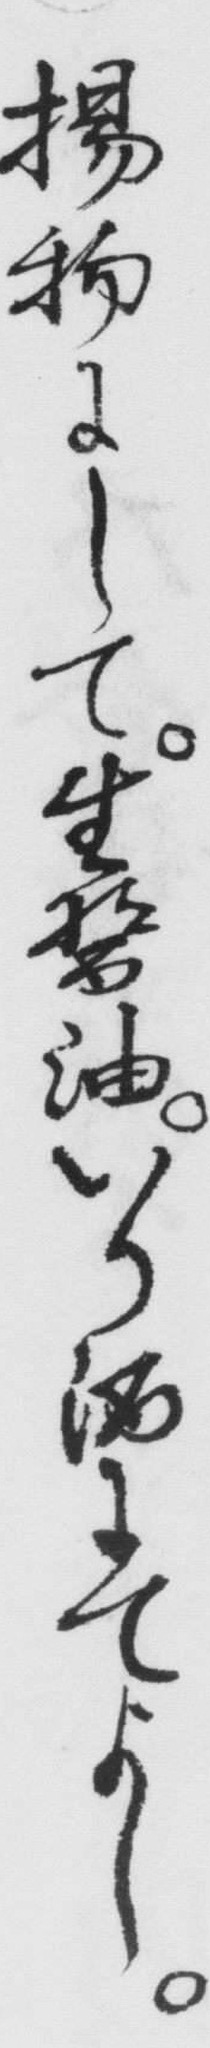○揚物にして。生醤油。いり酒にてよし。
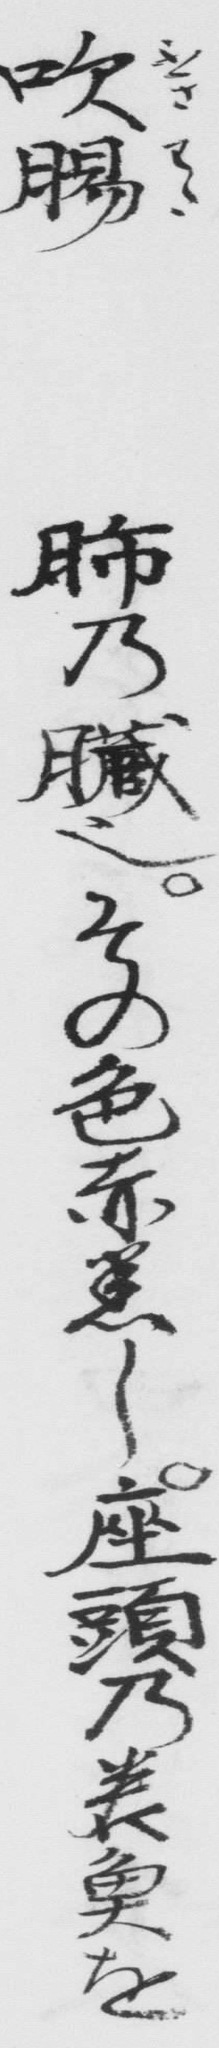吹腸肺の臓也。その色赤黒し。座頭の若魚を
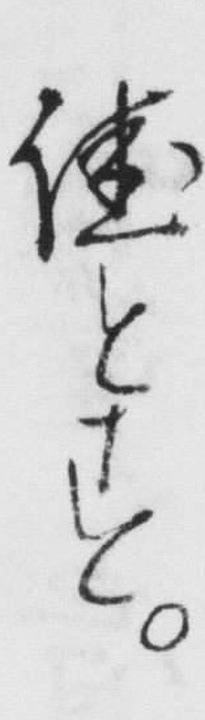佳とす。
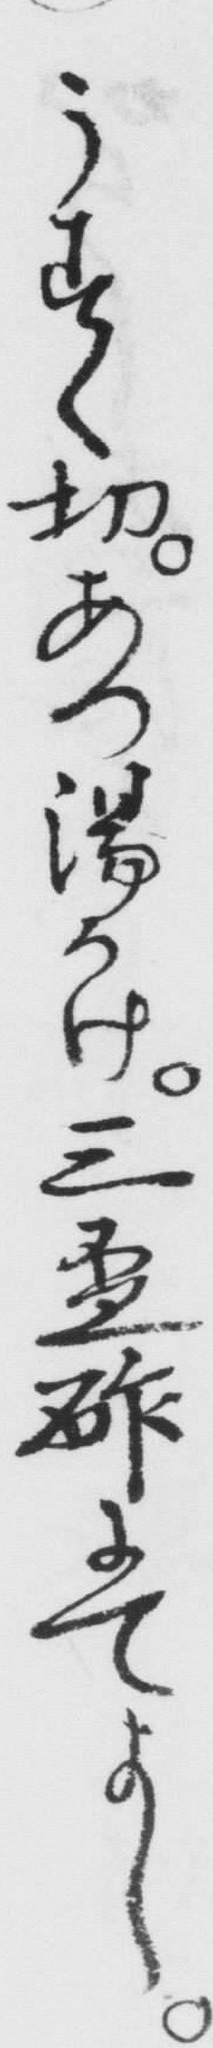○うすく切。あつ湯かけ。三盃酢にてよし。
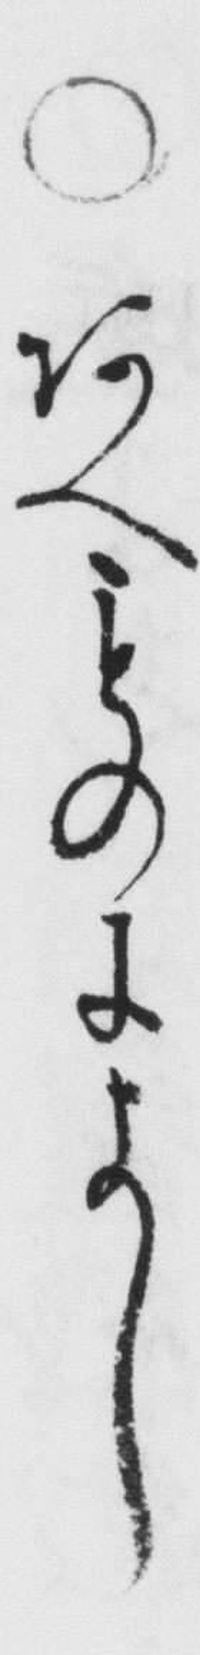○あへものによし
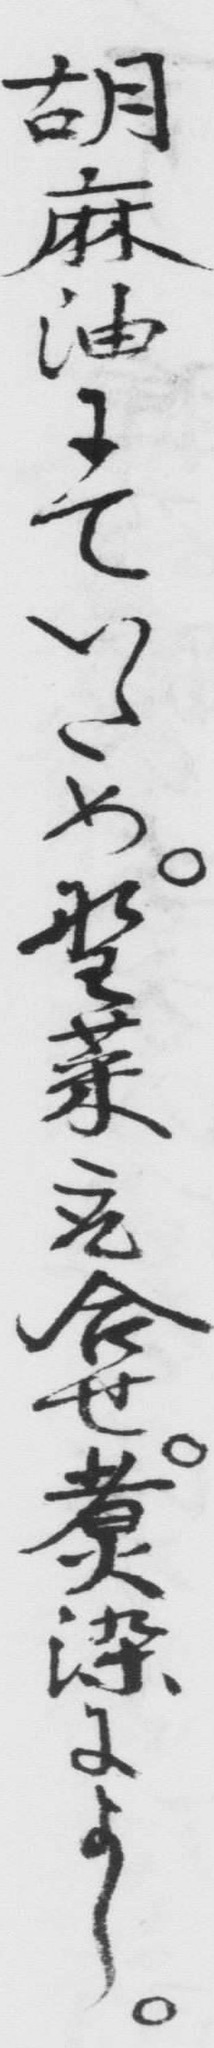○胡麻油にていため。野菜取合せ。煮染によし。
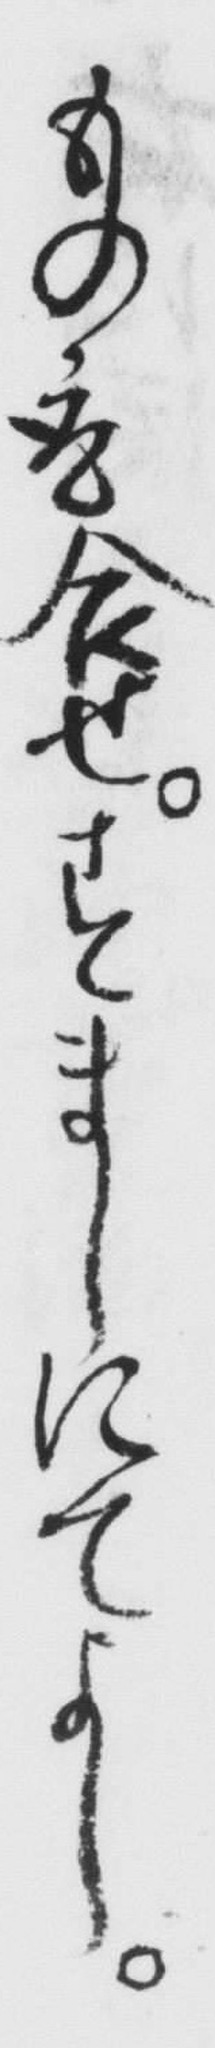○もの取合せ。すましにてよし。
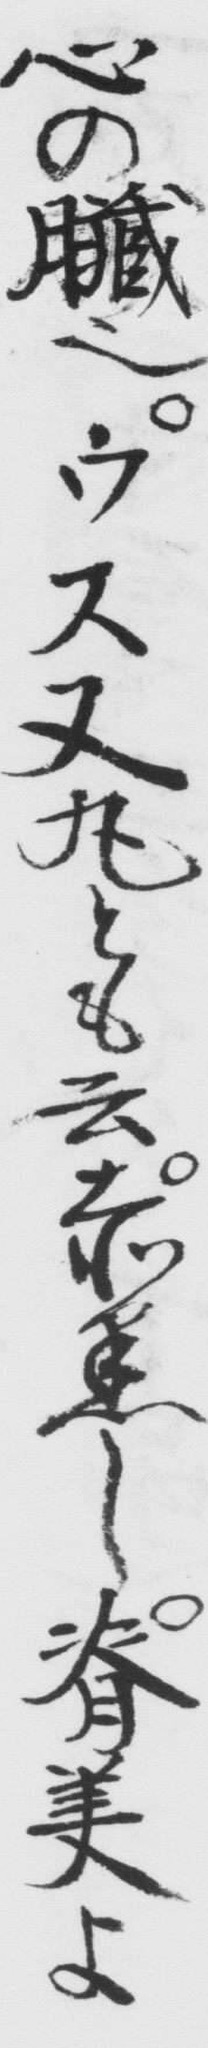ウス心の臓也。ウス又丸とも云。赤黒し。背美よ
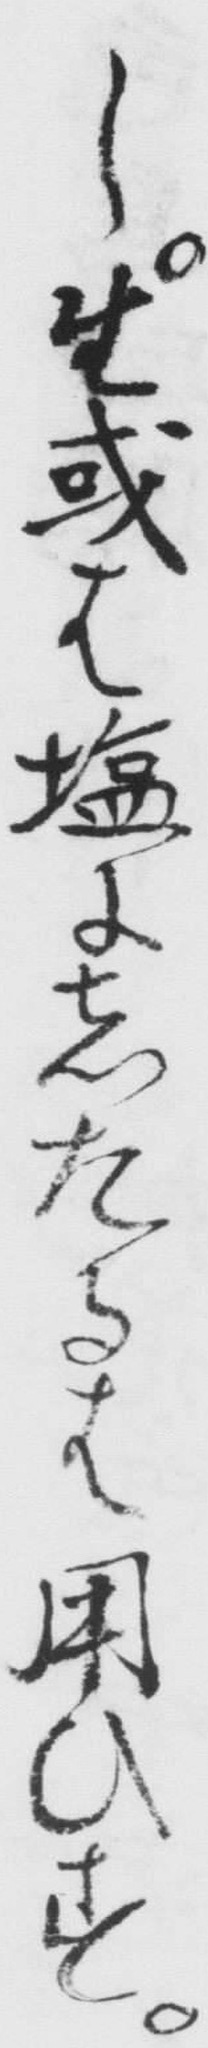し。生或は塩にしたるは用ひす。
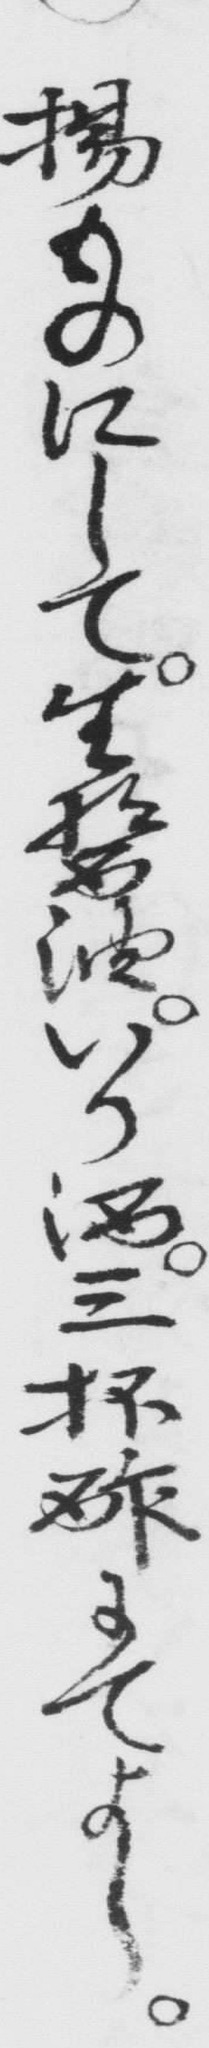○揚ものにして。生醤油。いり酒。三杯酢にてよし。
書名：鯨肉調味方
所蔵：大阪府立大学学術情報センター 国文学研究資料館
